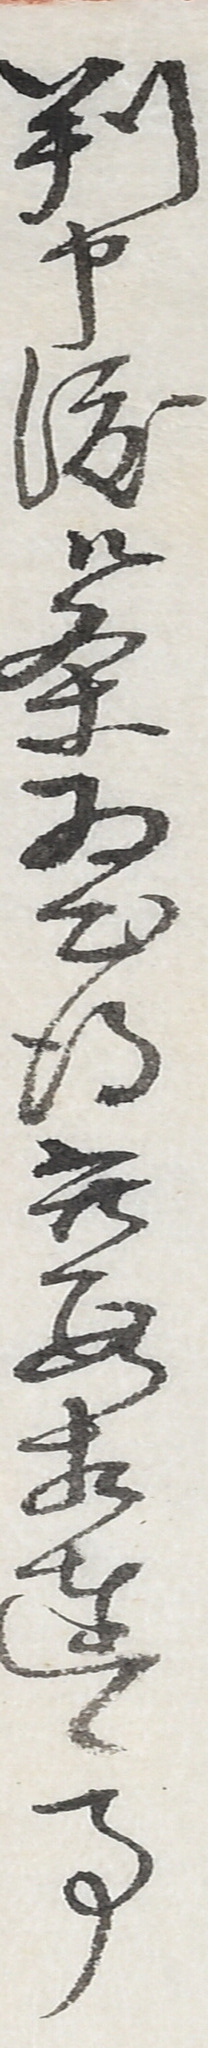判申渡候条為心得此段相達候事
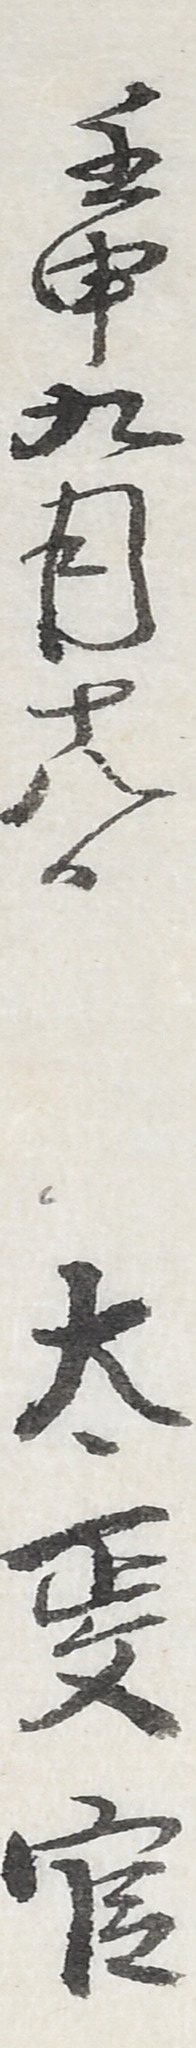壬申九月十八日太政官
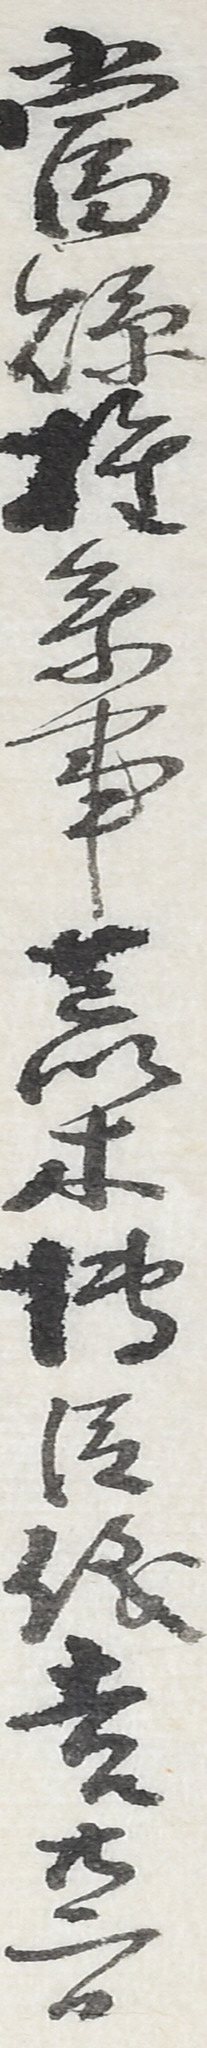当県権参事荒木博臣儀去ル廿二日
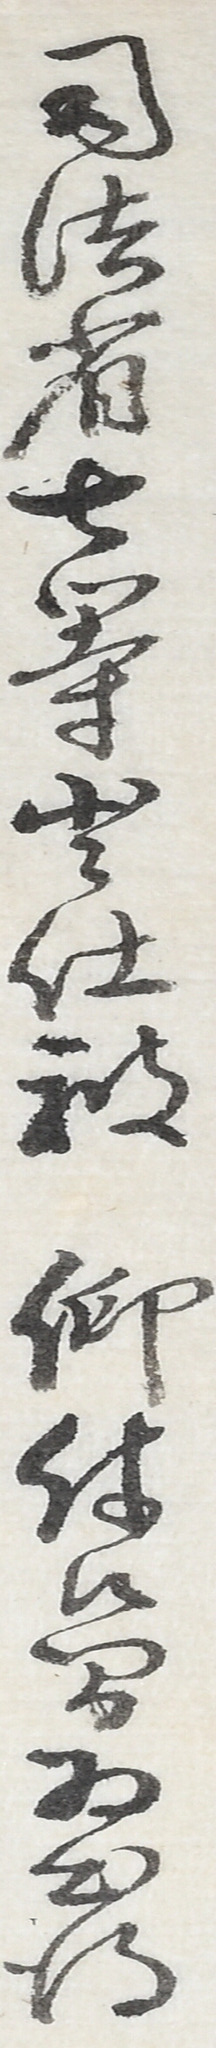司法省七等出仕被仰付候間為心得

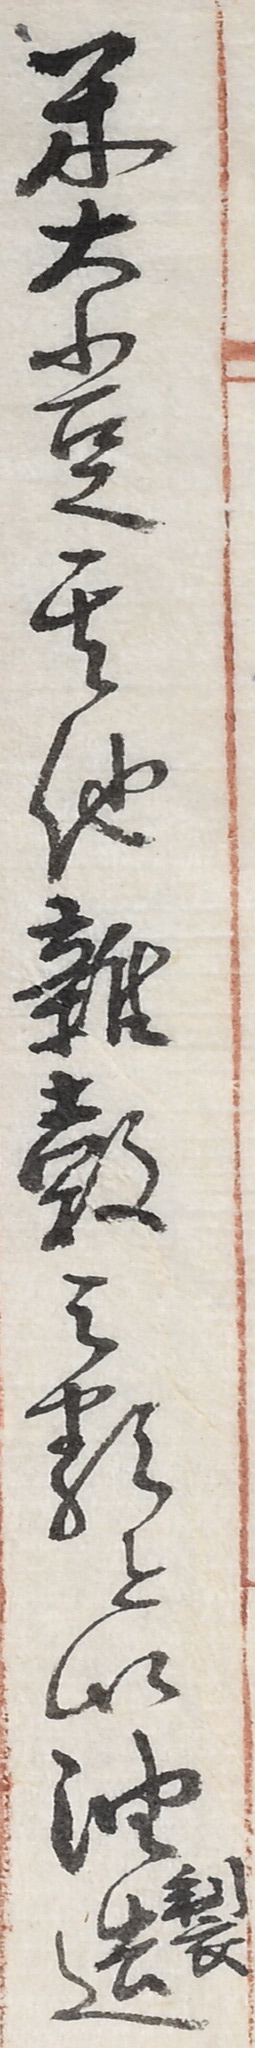米大小豆其他雑穀之類を以油製造
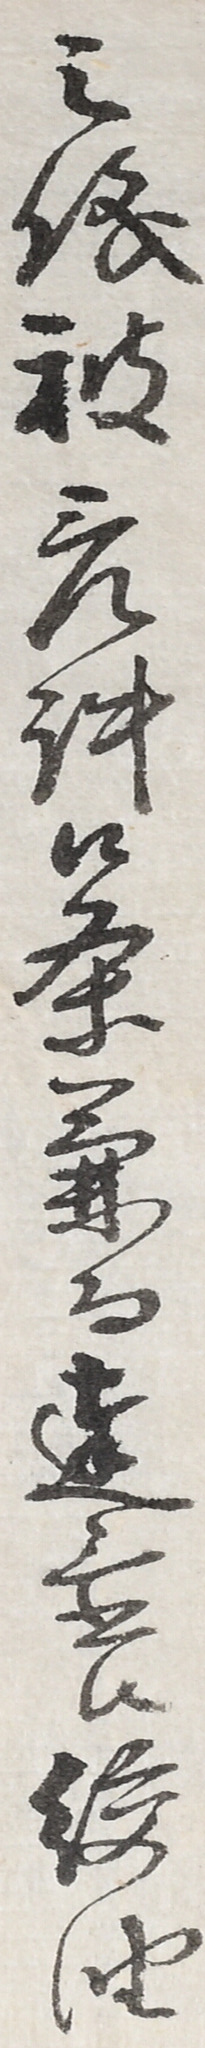之儀被差許候条兼而達置候絞油
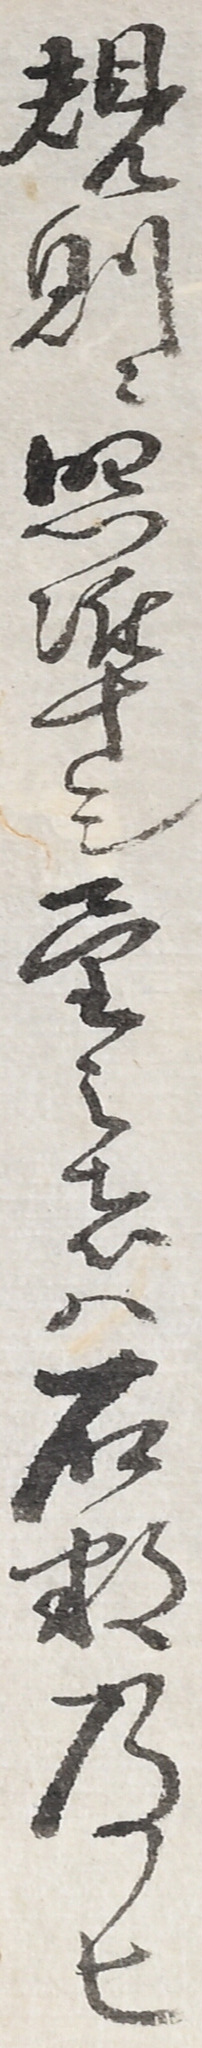規則ニ照準シ望之者ハ石数及ヒ
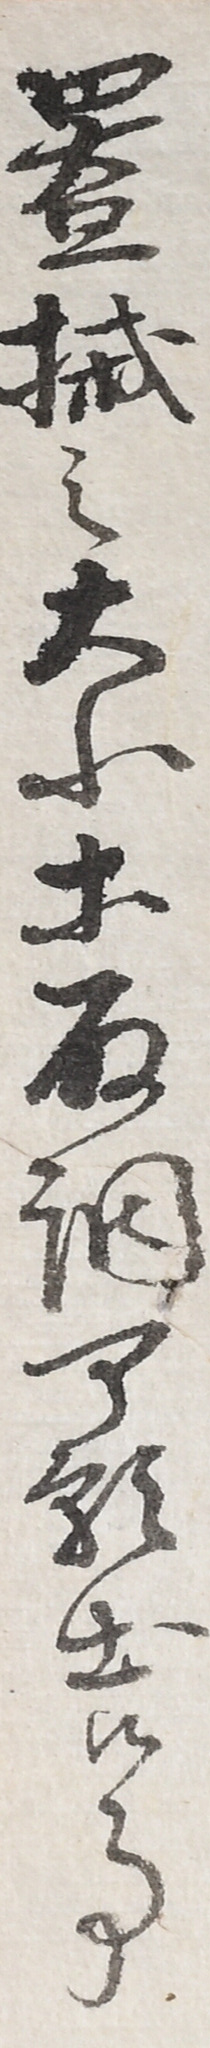器械之大小等取調可願出候事
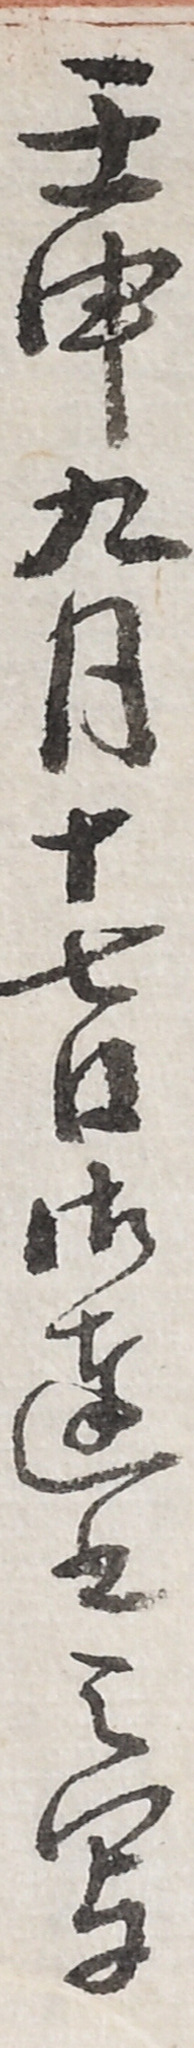壬申九月十七日御達書之写
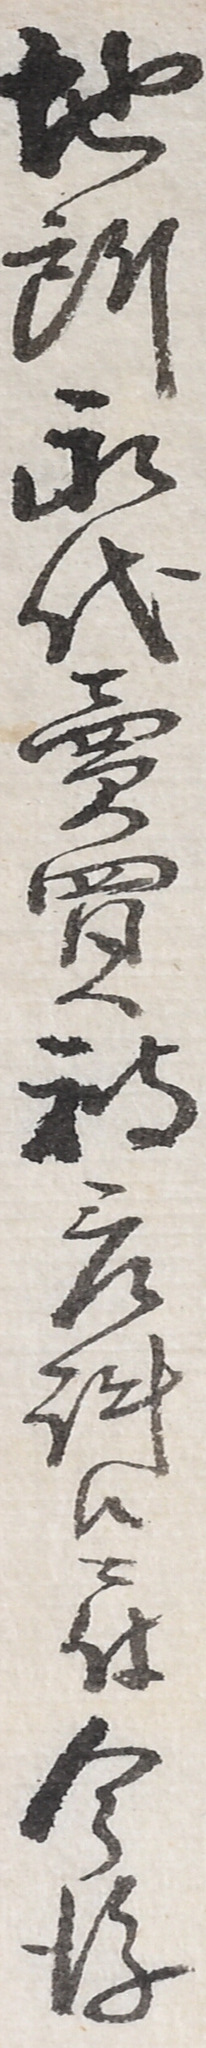地所永代売買被差許候ニ付今後
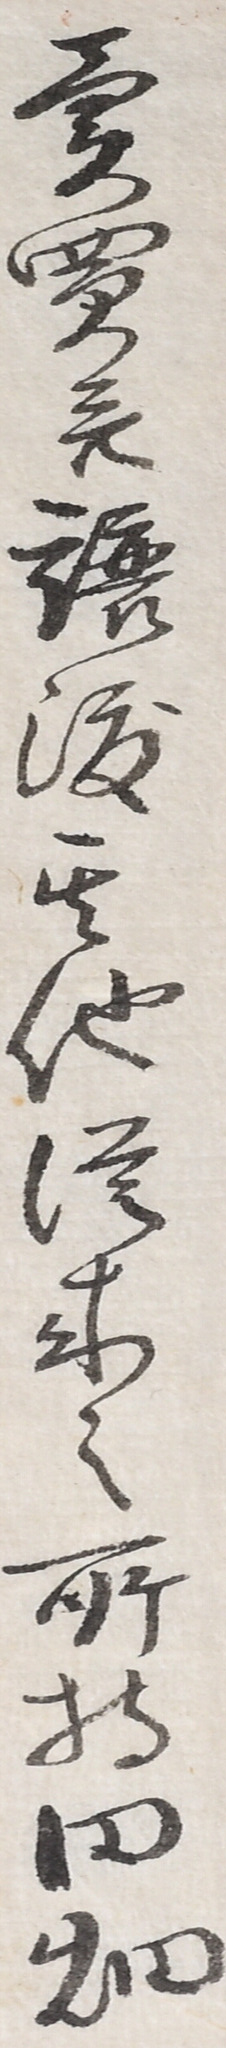売買幷譲渡其他従来之所持田畑
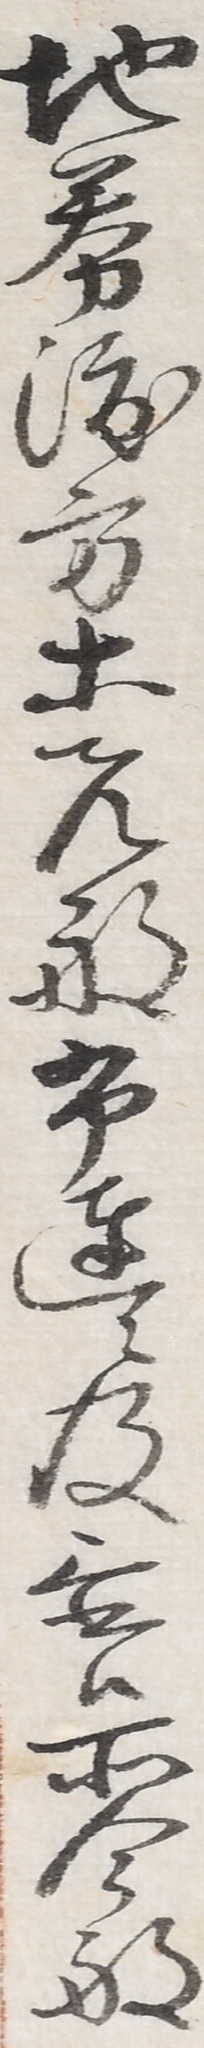地券渡方等先般布達ニ及置候所今般
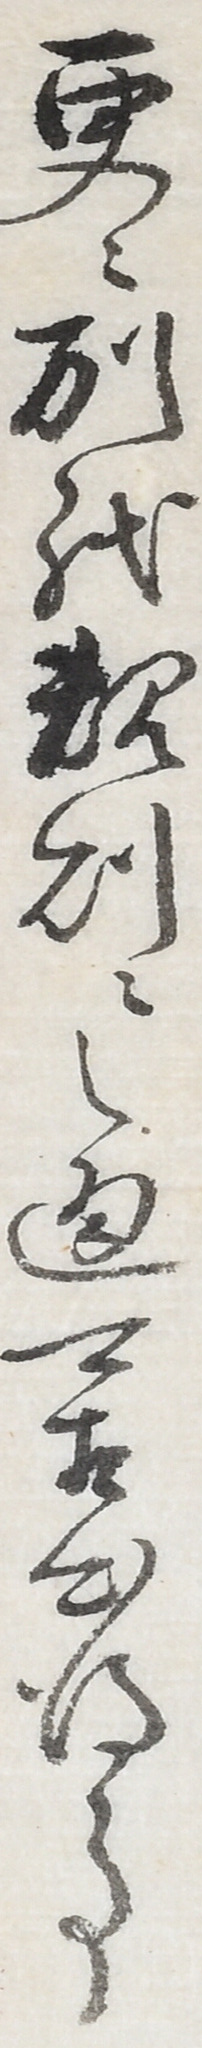更ニ別紙規則ニ之通可相心得事
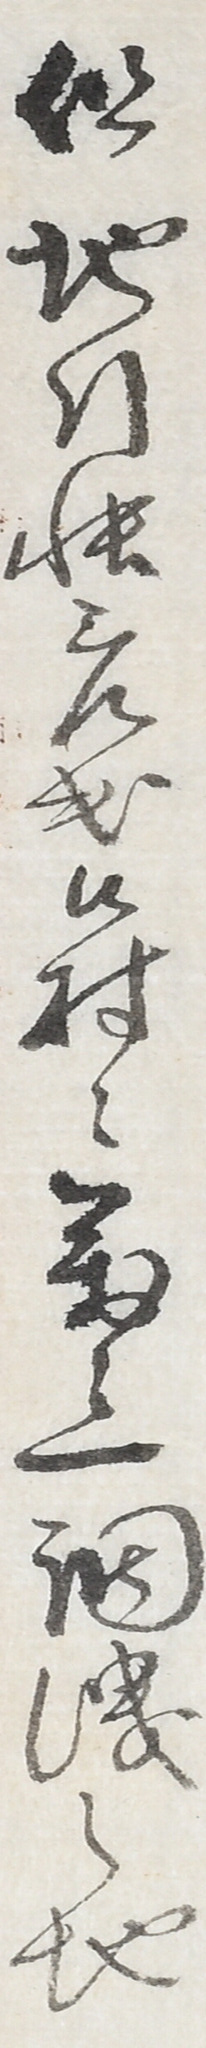但地引帳差出候村々万之一調洩之地
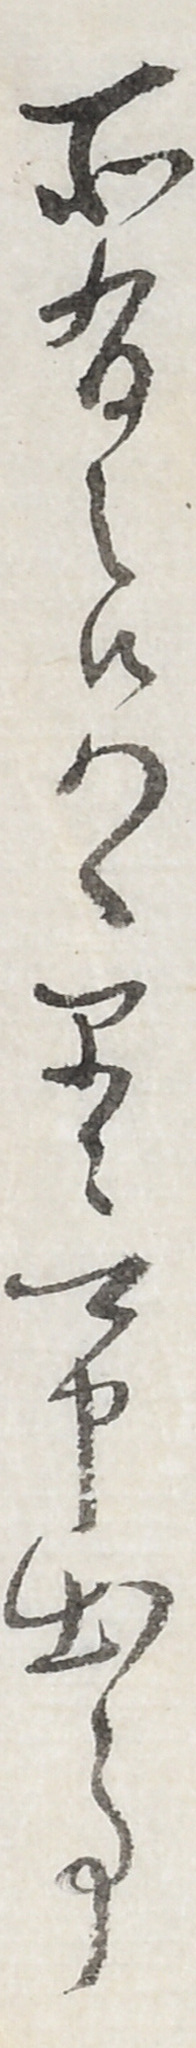所有之候ハゝ早々可申出事
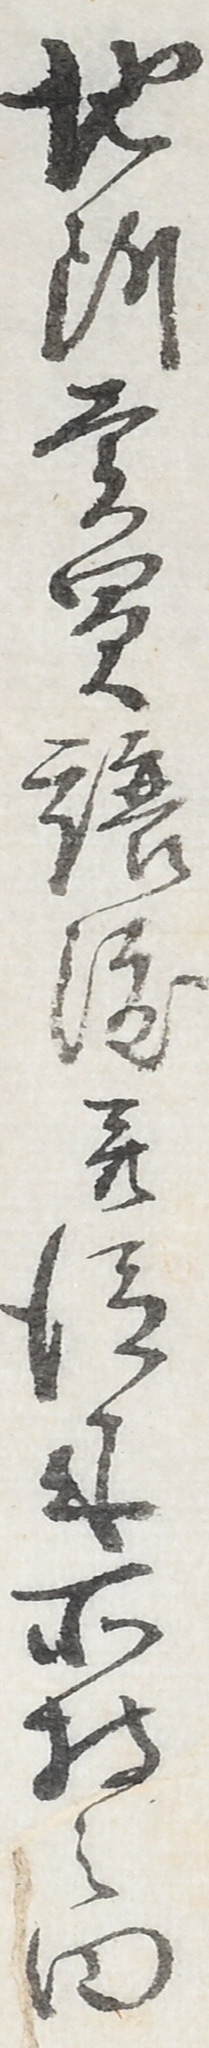地所売買譲渡幷従来所持之田
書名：壹番・御布告一式
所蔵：伊那市立高遠町図書館・合同会社AMANE
